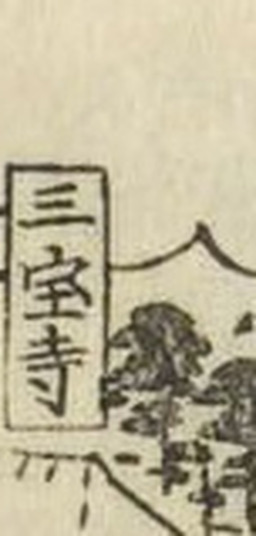三宝寺

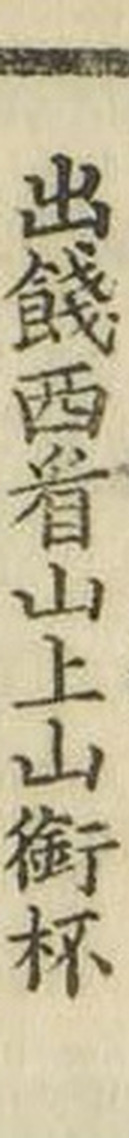出餞西看山上山銜杯
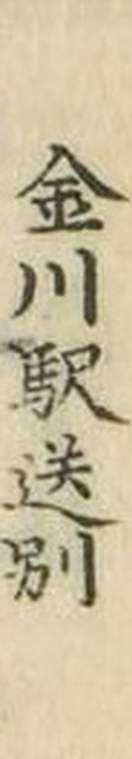金川駅送別
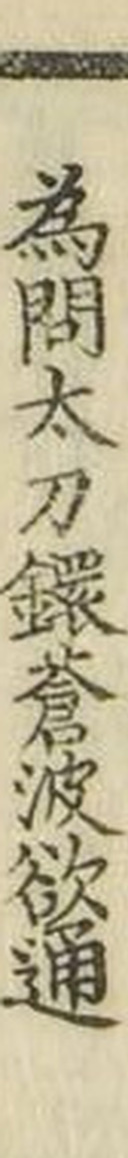為問太刀鐶蒼波欲通
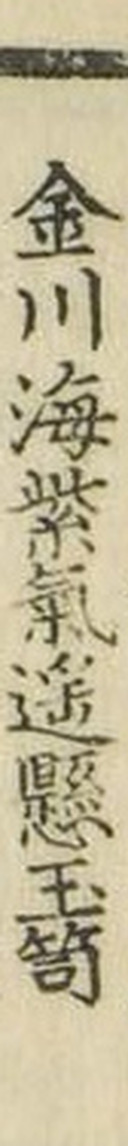金川海紫氣遥懸玉笥
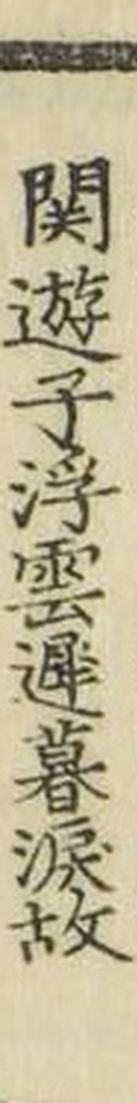関遊子浮雲遅暮涙故
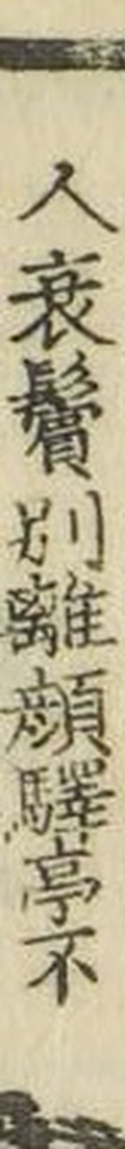人衰鬢別離顔驛亭不
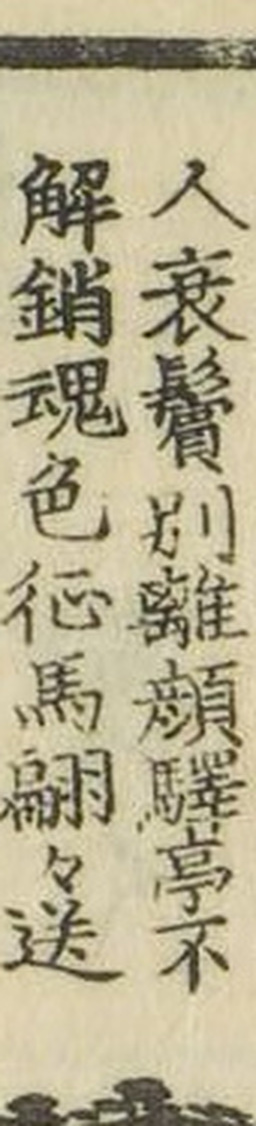解銷魂色征馬翩々送

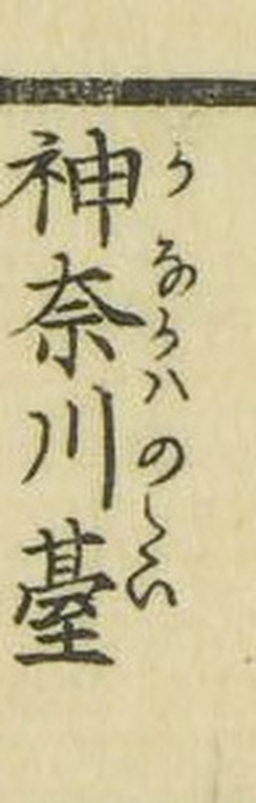神奈川臺
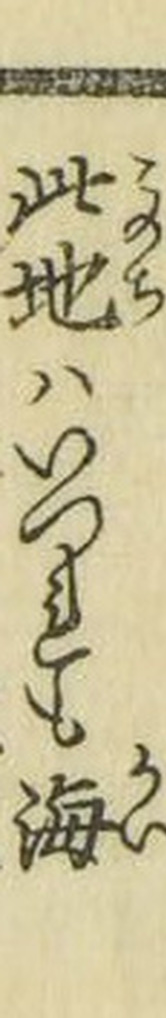此地はいつれも海
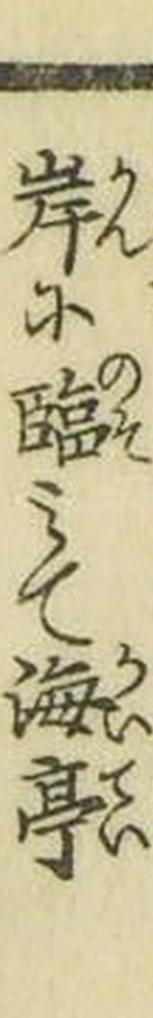岸に臨みて海亭
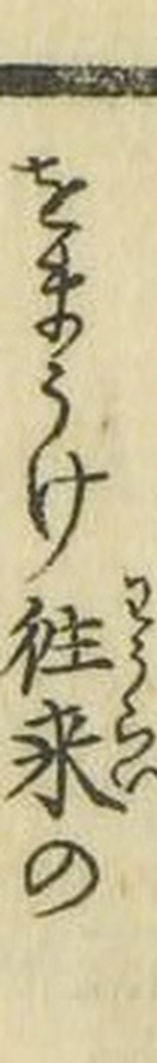をまうけ往来の
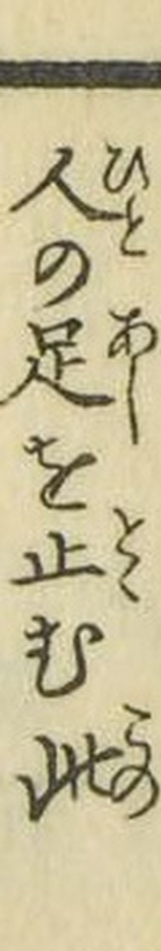人の足を止む此
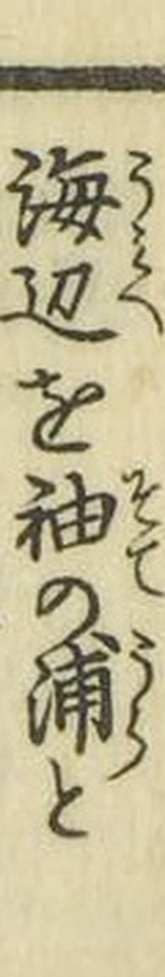海辺を袖の浦と
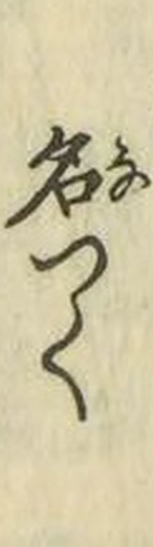名つく
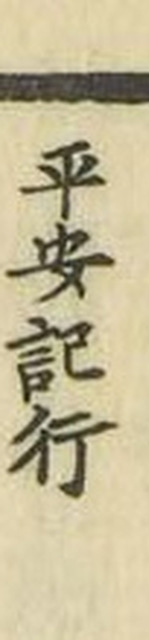平安紀行
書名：江戸名所図会 20巻 巻之5
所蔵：東京学芸大学教育コンテンツアーカイブ
